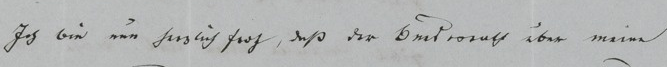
Ich bin nun herzlich froh, daß der Bundesrath über meine
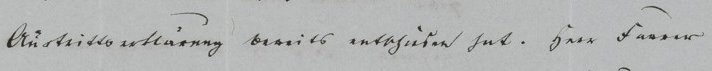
Austrittserklärung bereits entschieden hat. Herr Furrer
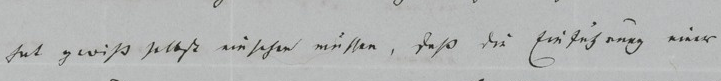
hat gewiß selbst einsehen müssen, daß die Einführung einer
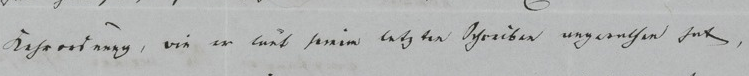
Kehrordnung, wie er laut seinem letzten Schreiben angerathen hat,
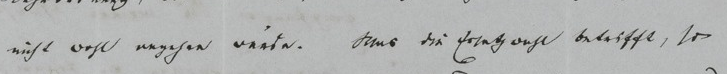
nicht wohl angehen würde. Was die Ersatzwahl betrifft, so
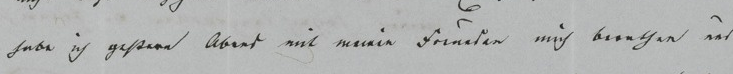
habe ich gestern Abend mit meinen Freunden mich berathen und
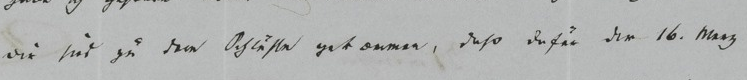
wir sind zu dem Schlusse gekommen, daß dafür der 16. Merz
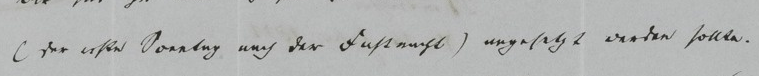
(der erste Sonntag nach der Fastnacht) angesetzt werden sollte.
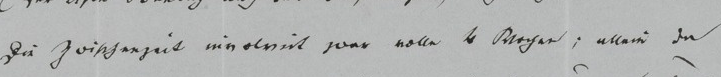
Die Zwischenzeit involvirt zwar volle 4 Wochen; allein da
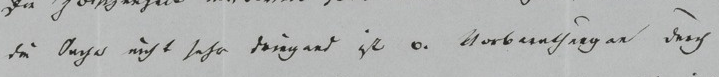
die Sache nicht sehr dringend ist &. Vorberathungen durch
